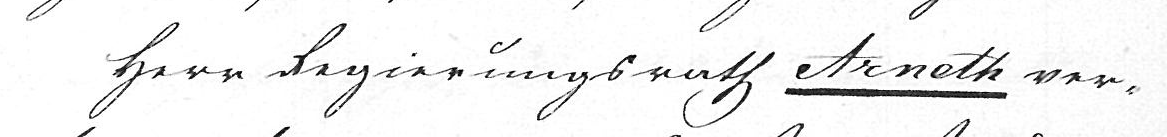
Herr Regierungsrath Arneth ver-
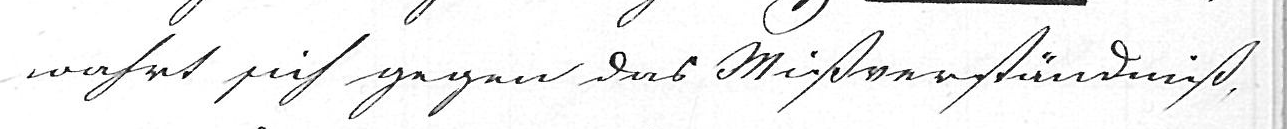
wahrt sich gegen das Mißverständniß,
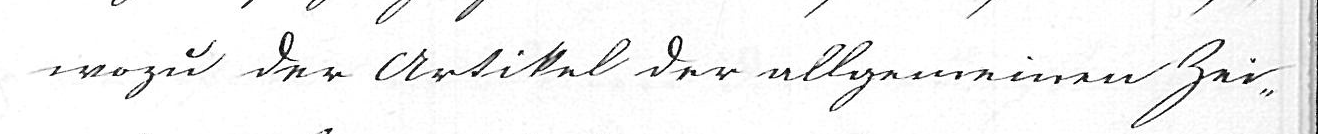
wozu der Artikel der allgemeinen Zei-
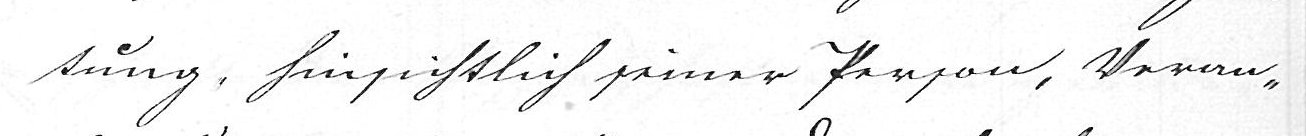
tung, hinsichtlich seiner Person, Veran-
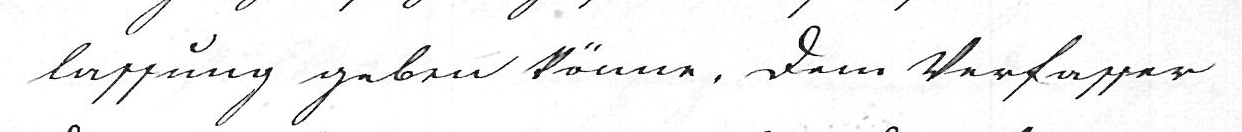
lassung geben könne. Dem Verfasser
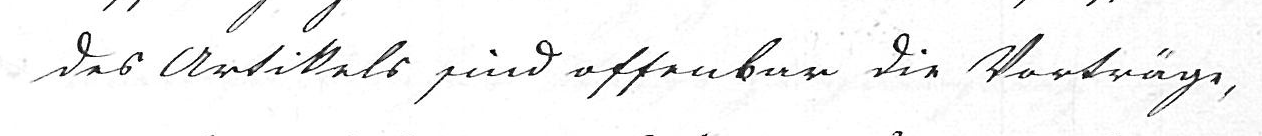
des Artikel sind offenbar die Vorträge,
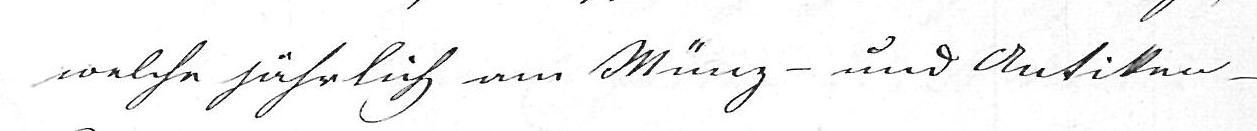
welche jährlich an Münz- und Antiken-
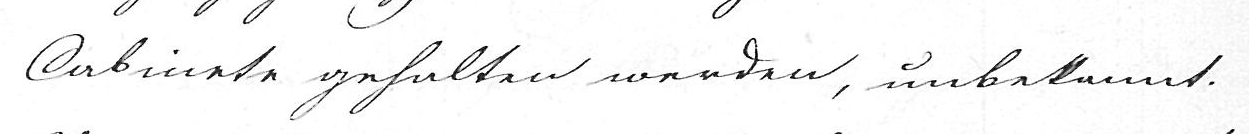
Cabinete gehalten werden, unbekannt.
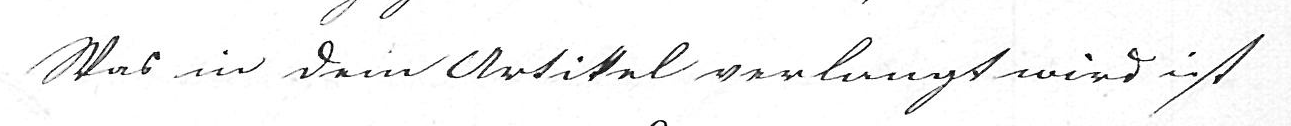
Was in dem Artikel verlangt wird ist
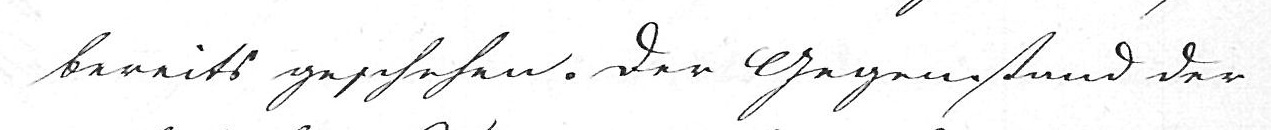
bereits geschehen. Der Gegenstand der
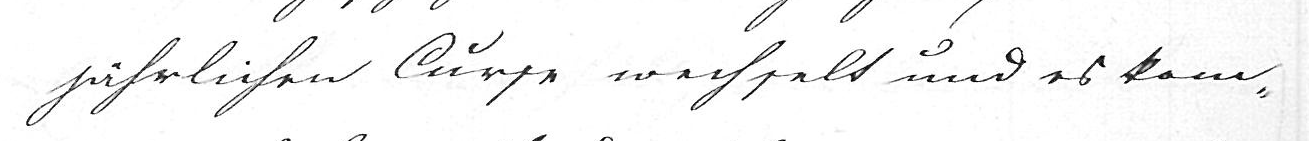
jährlichen Curse wechselt und es kom-
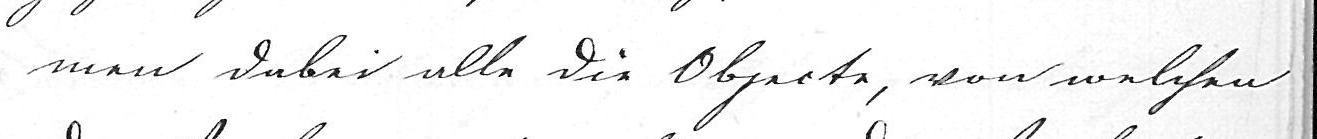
men dabei alle die Objecte, von welchen
